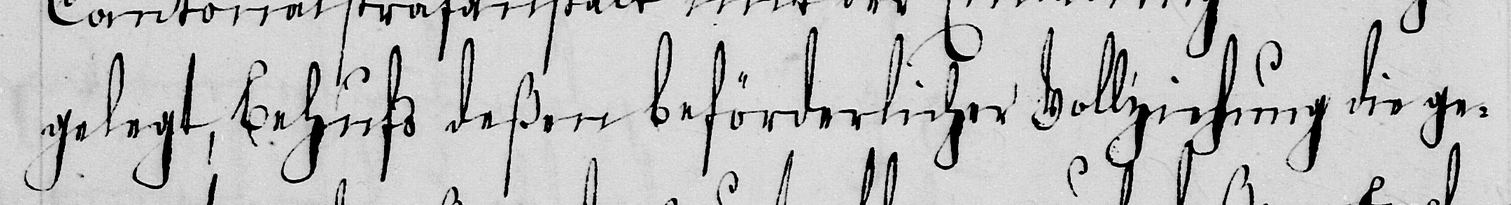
gelegt, Behufs deßen beförderlicher Vollziehung die
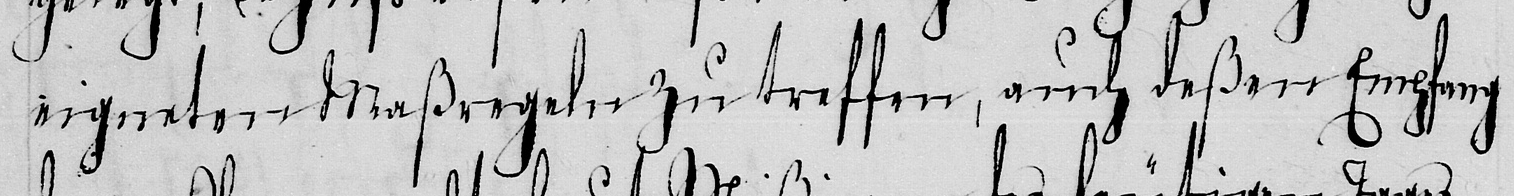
eigneten Maßregeln zu treffen, auch deßen Empfang
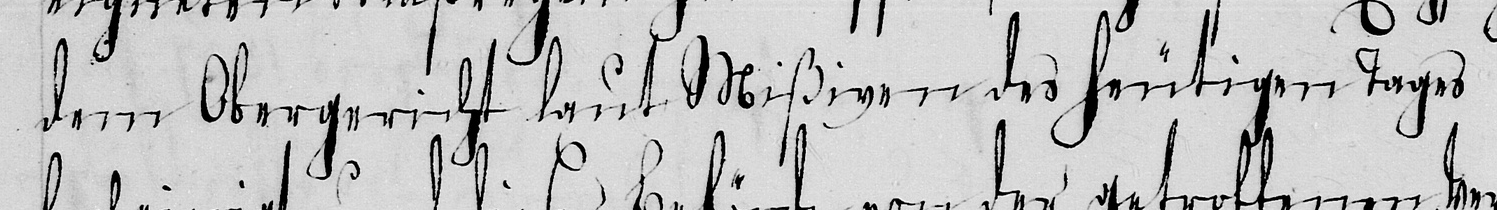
dem Obergericht laut Mißiven des heutigen Tages
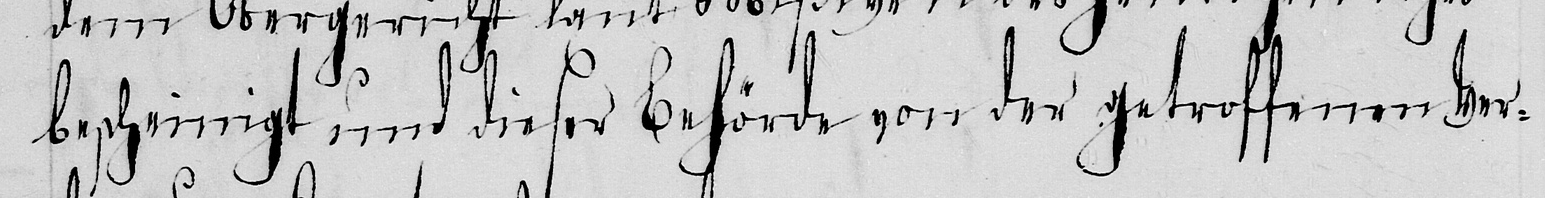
bescheinigt und dieser Behörde von der getroffenen Ver¬
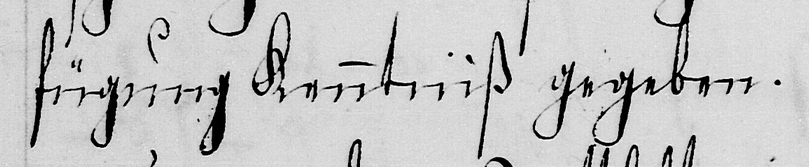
fügung Kenntniß gegeben.
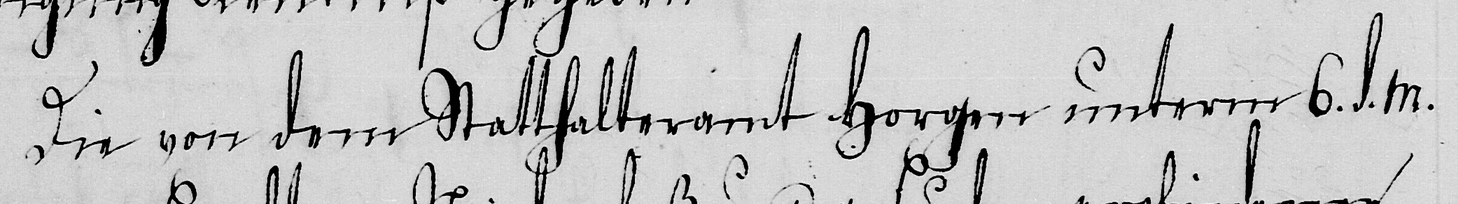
Die von dem Statthalteramt Horgen unterm 6. d. M.
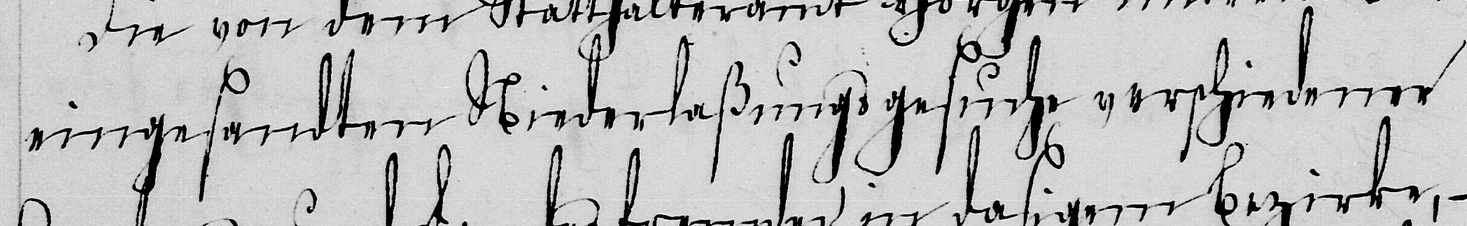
eingesandten Niederlaßungsgesuche verschiedener
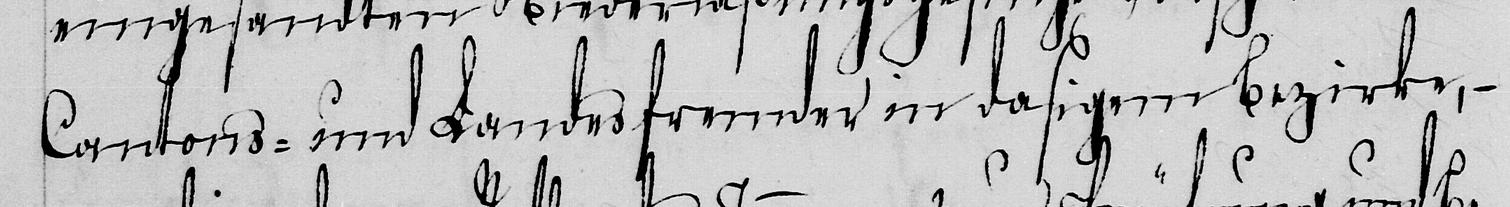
Cantons- und Landesfremder in dasigem Bezirke, –
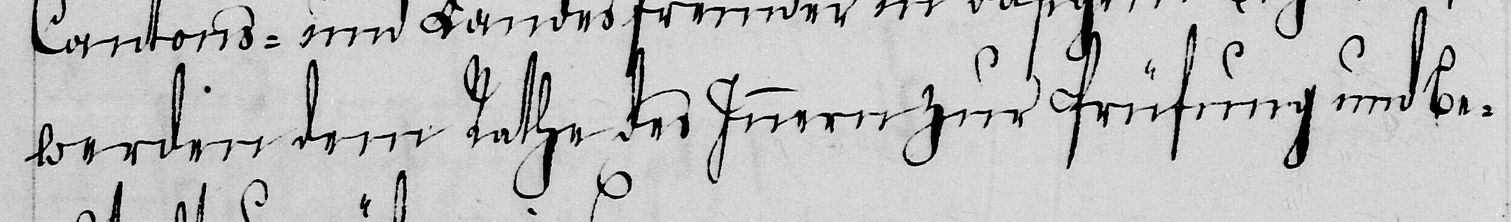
werden dem Rathe des Innern zur Prüfung und Be¬
